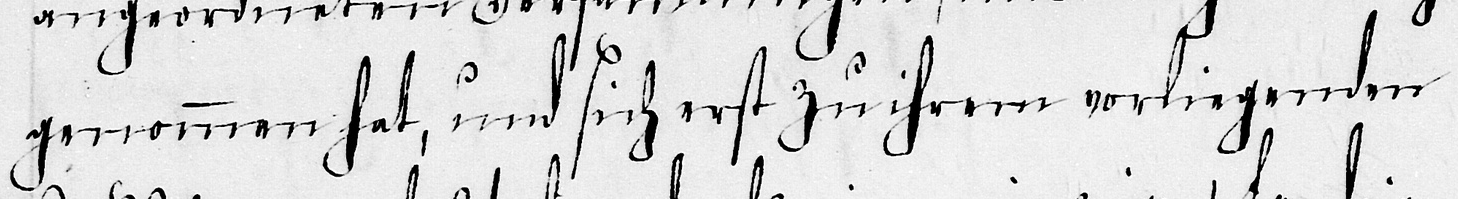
genommen hat, und sich erst zu ihrem vorliegenden
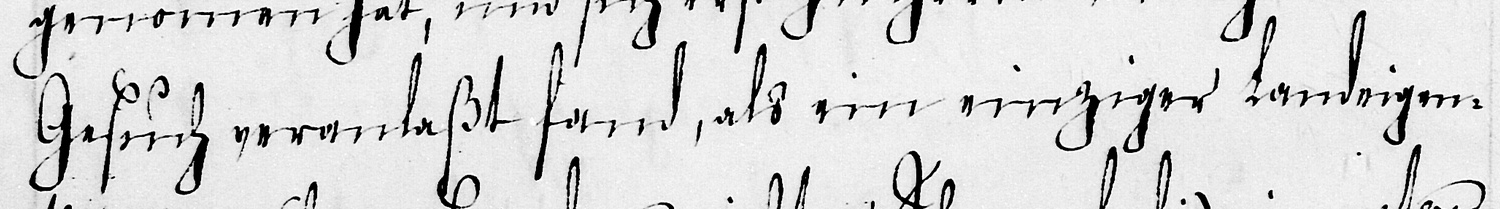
Gesuch veranlaßt fand, als ein einziger Landeigen¬
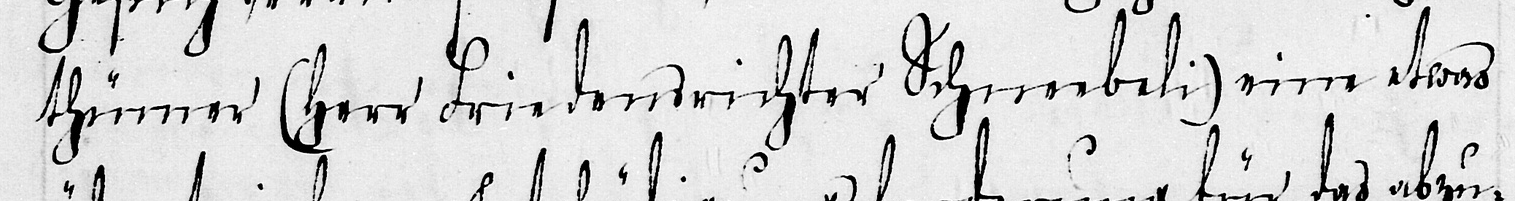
thümer (Herr Friedensrichter Schneebeli) eine etwas
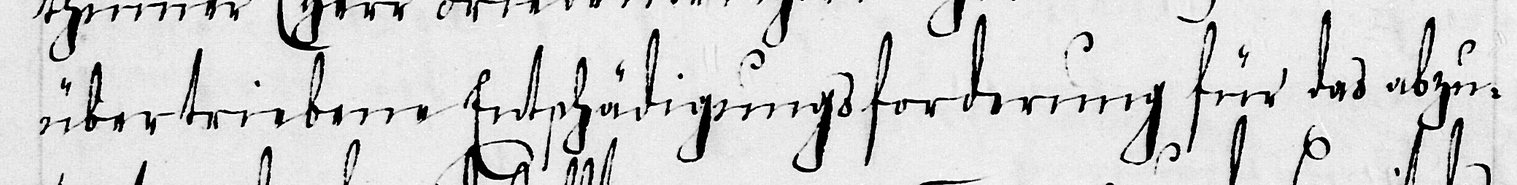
übertriebene Entschädigungsforderung für das abzu¬
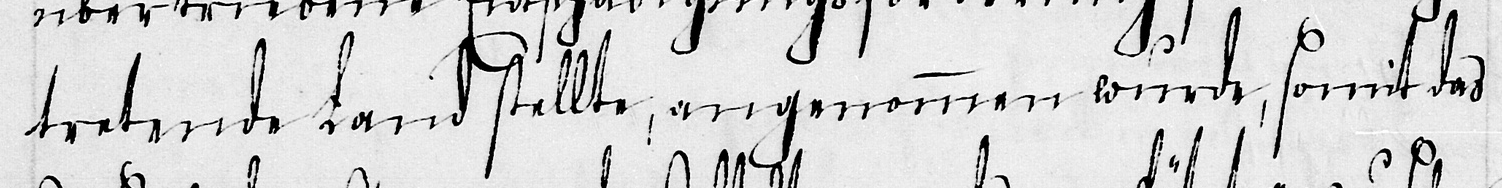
tretende Land stellte, angenommen wurde, somit das
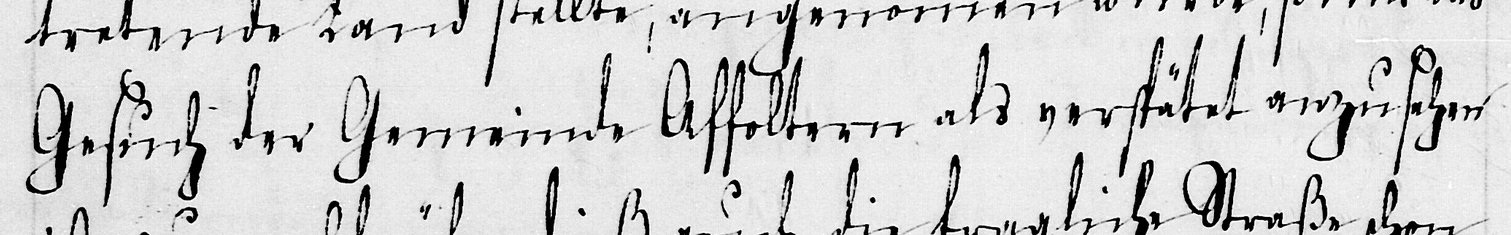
Gesuch der Gemeinde Affoltern als verspätet anzusehen
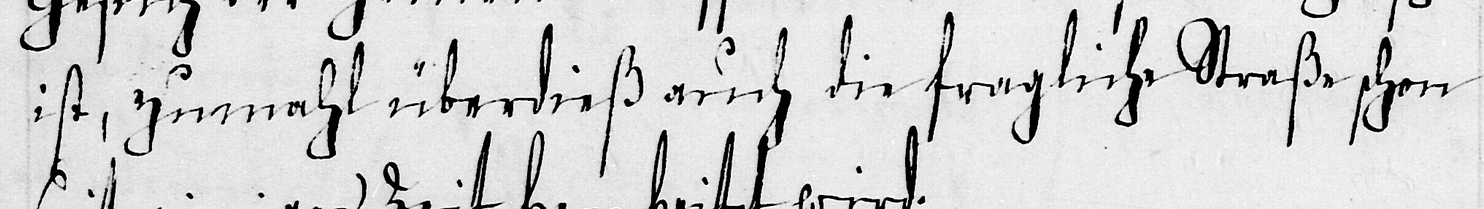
ist, zumahl überdieß auch die fragliche Straße schon
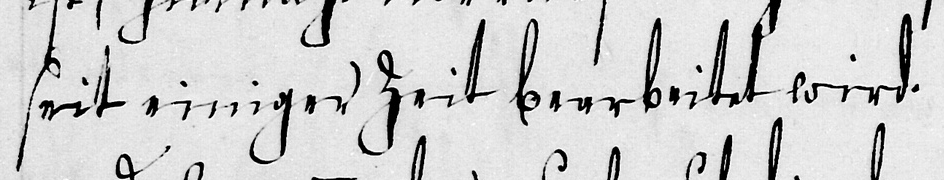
seit einiger Zeit bearbeitet wird.
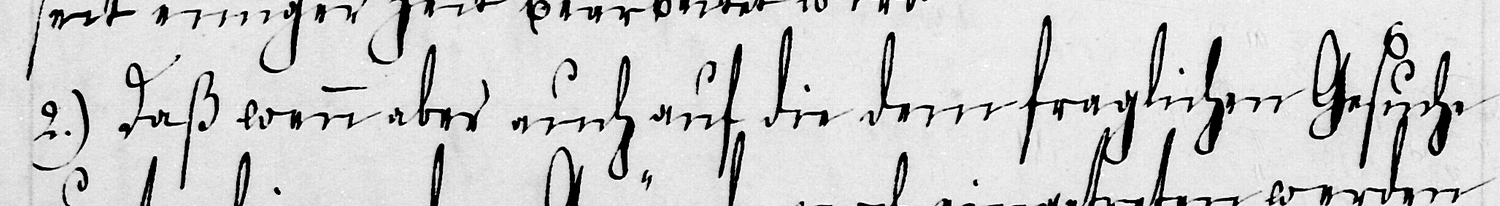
2.) Daß wenn aber auch auf die dem fraglichen Gesuche
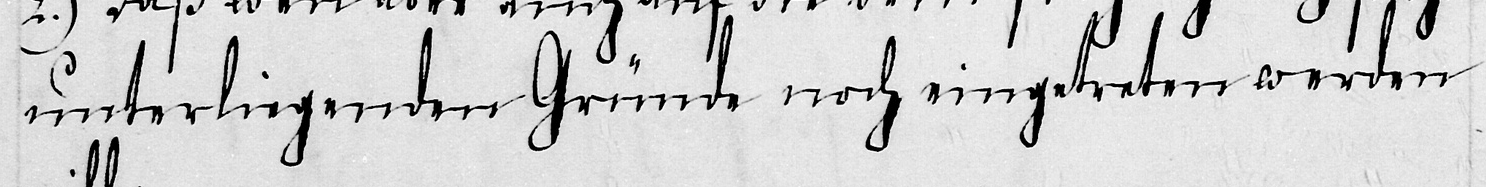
unterliegenden Gründe noch eingetreten werden
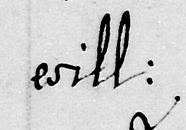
will:
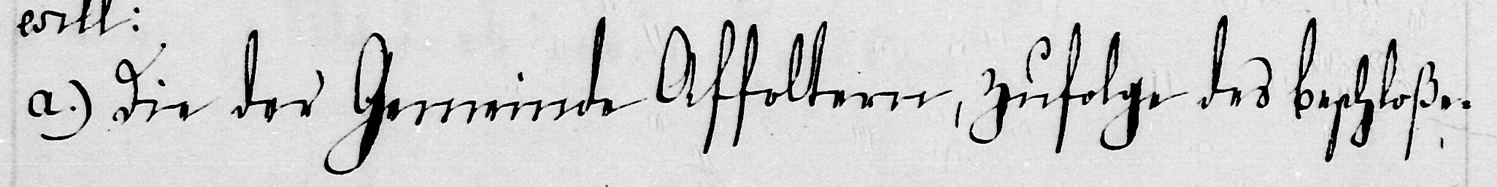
a.) Die der Gemeinde Affoltern, zufolge des beschloße-
